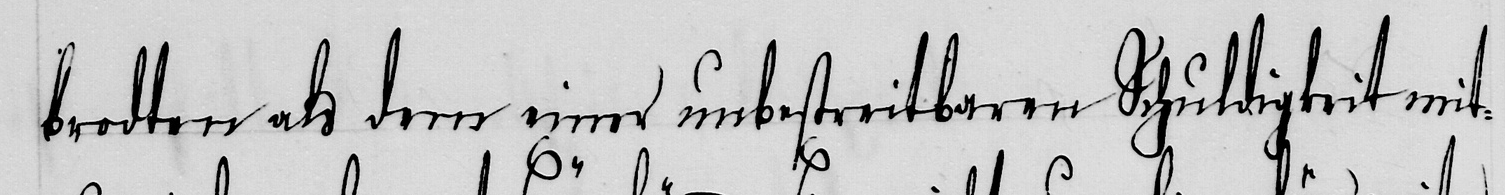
brodten als dem einer unbestreitbaren Schuldigkeit mi¬
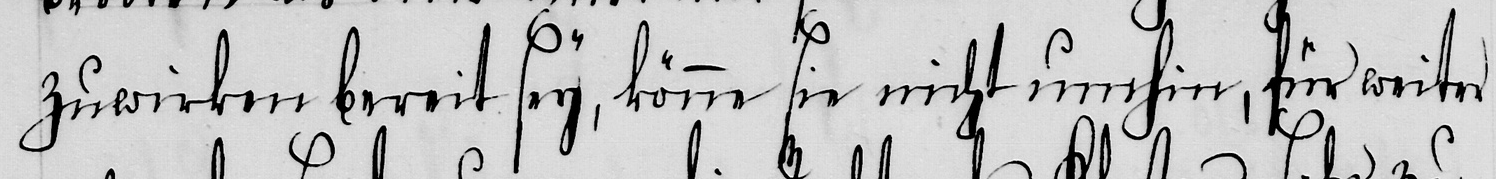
tzuwirken bereit sey, könne sie nicht umhin, für weiter
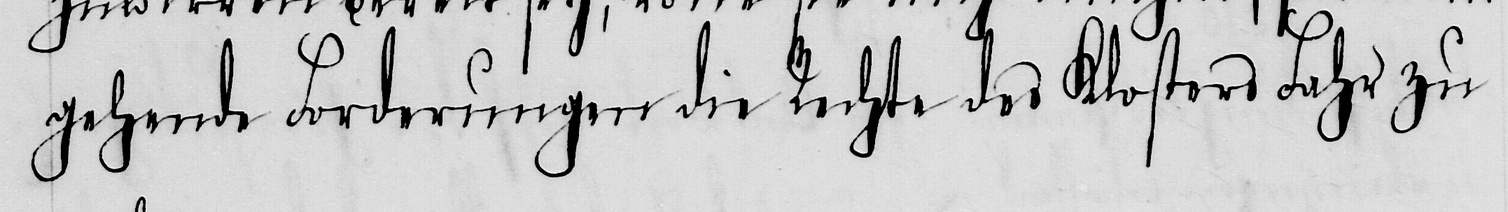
gehende Forderungen die Rechte des Klosters Fahr zu
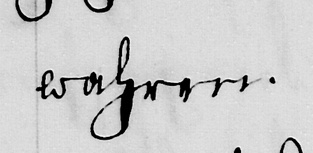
wahren.
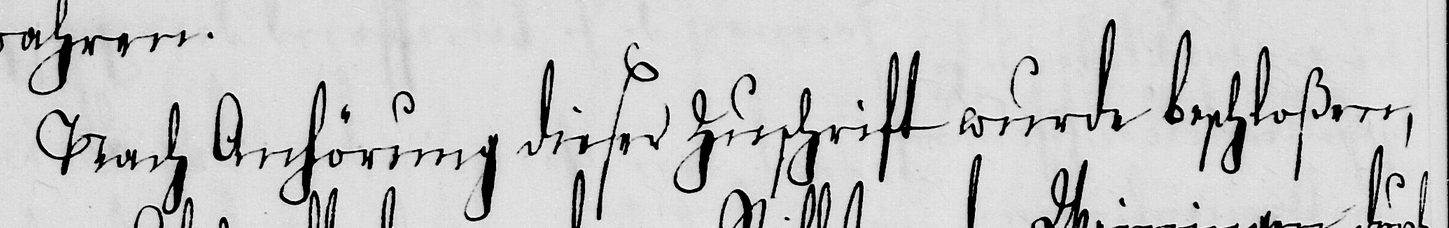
Nach Anhörung dieser Zuschrift wurde beschloßen,
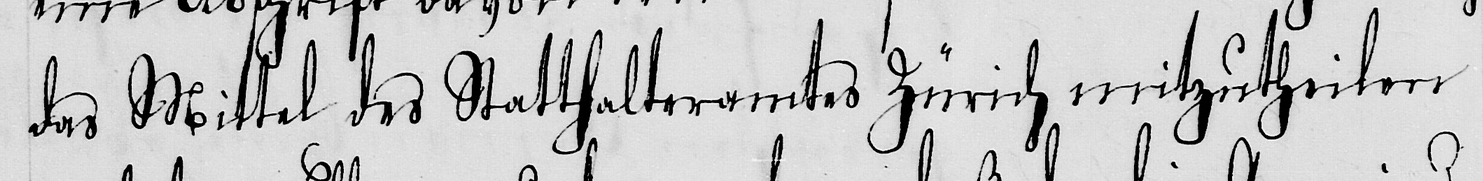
das Mittel des Statthalteramtes Zürich mitzutheilen
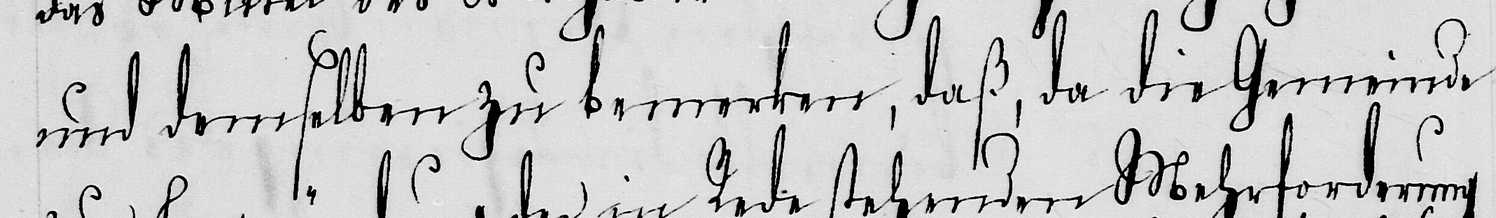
und demselben zu bemerken, daß, da die Gemeinde
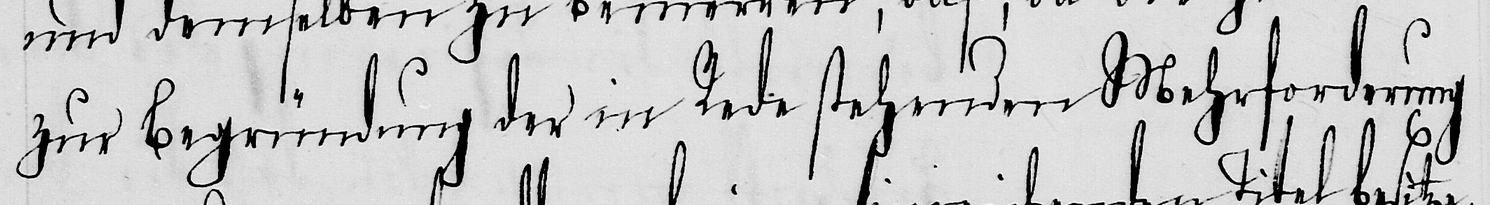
zur Begründung der in Rede stehenden Mehrforderung
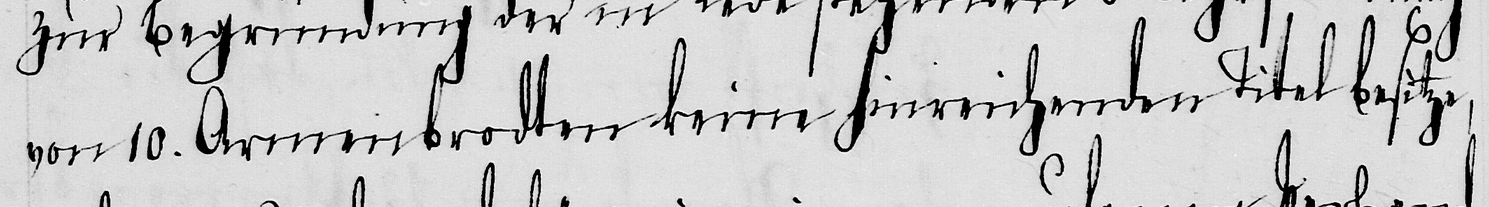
von 10. Armenbrodten keine hinreichende Titel besitze,
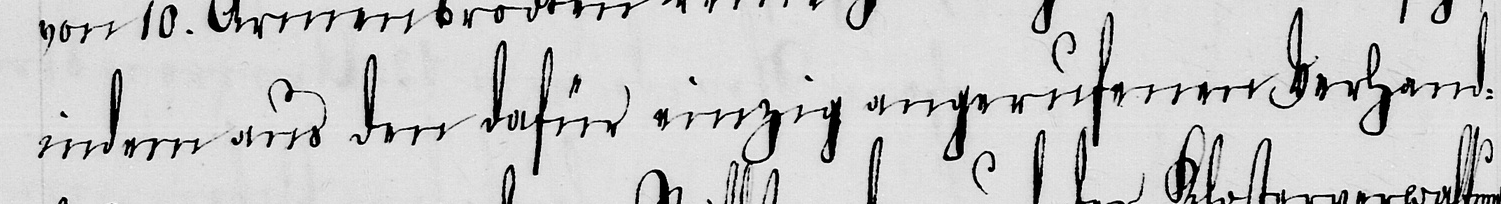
indem aus den dafür einzig angerufenen Verhand¬
